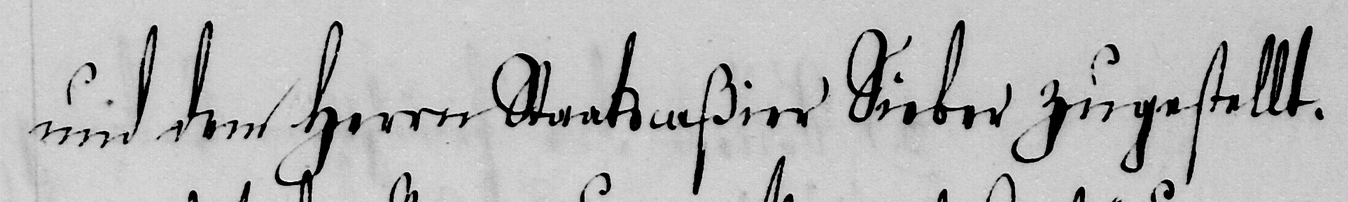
und dem Herrn Staatscaßier Sieber zugestellt.
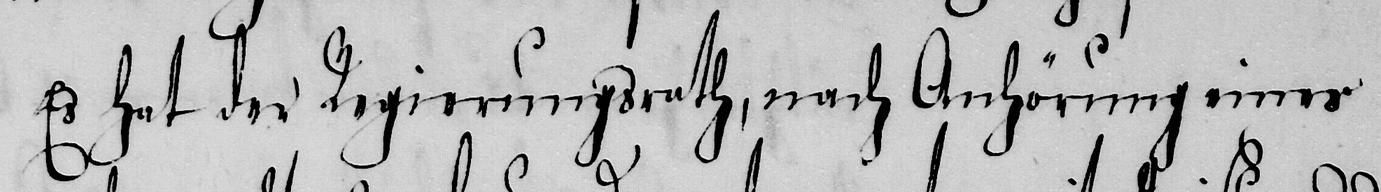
Es hat der Regierungsrath, nach Anhörung eines
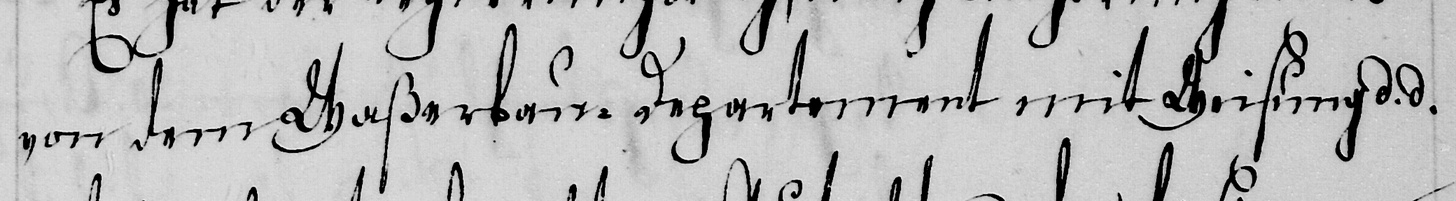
von dem Waßerbau-Departement mit Weisung d.
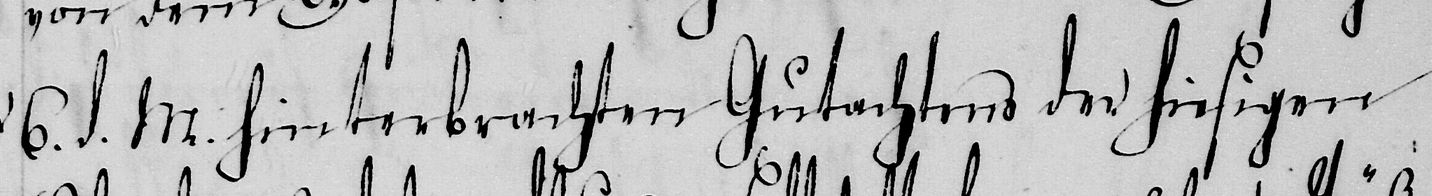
6. d. M. hinterbrachten Gutachtens der hiesigen
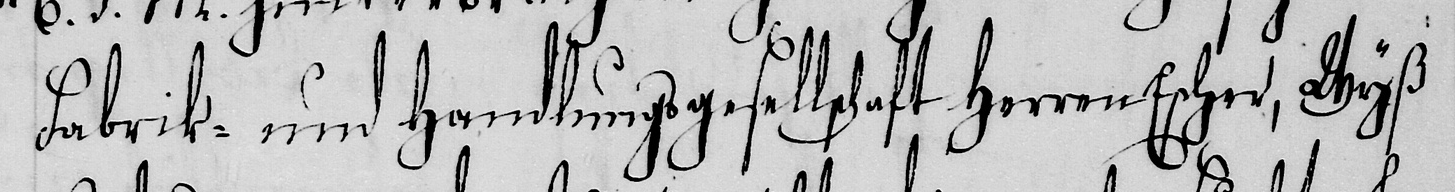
Fabrik- und Handlungsgesellschaft Herren
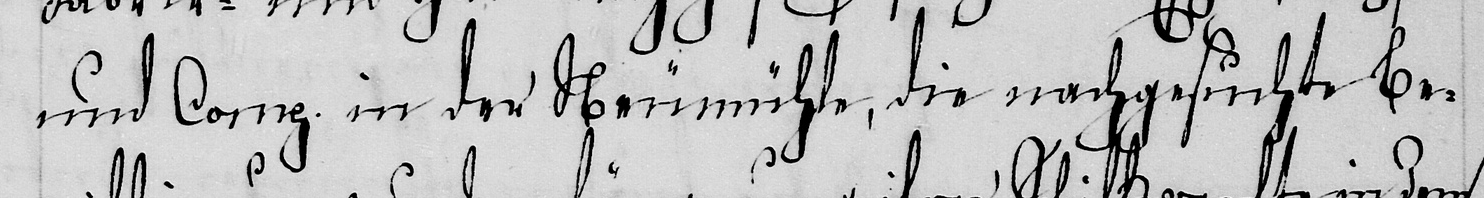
und Comp. in der Neumühle, die nachgesuchte Be¬
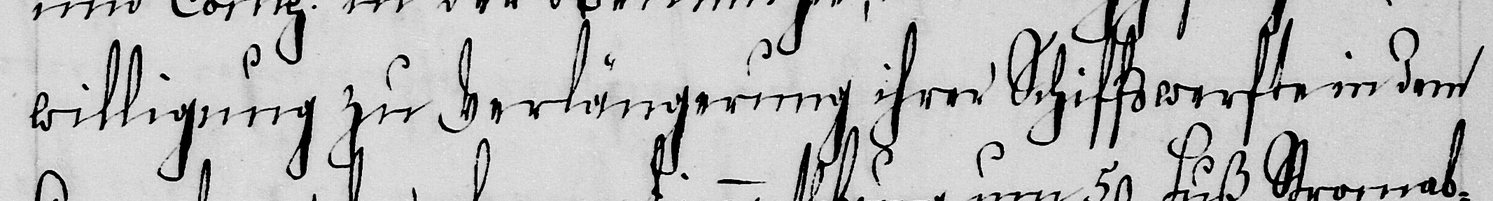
willigung zu Verlängerung ihrer Schiffswerfte in den
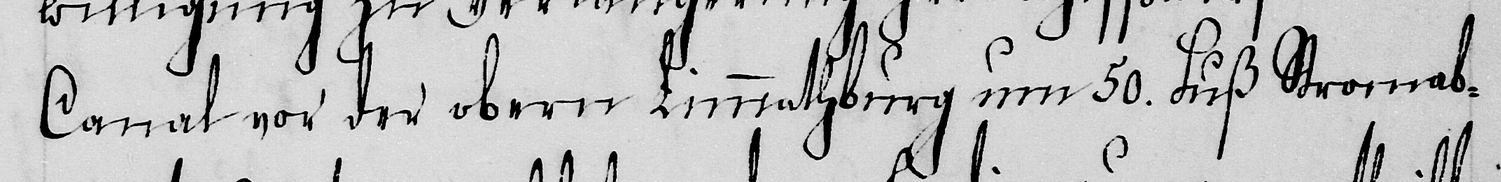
Canal vor der obern Limmathburg um 50. Fuß Stromab¬
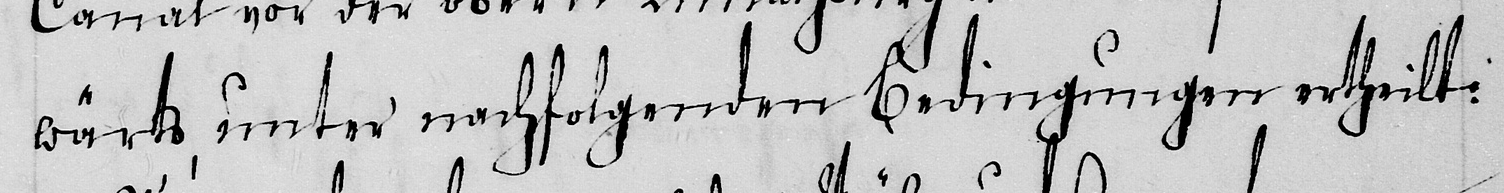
wärts, unter nachfolgenden Bedingungen ertheilt:
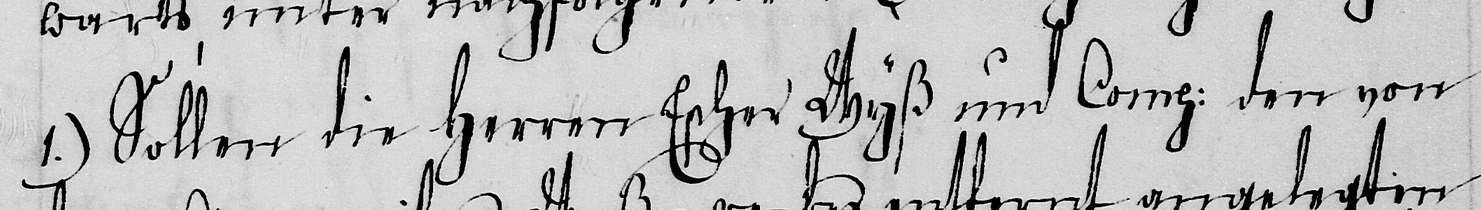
1.) Sollen die Herren Escher Wyß und Comp: den von
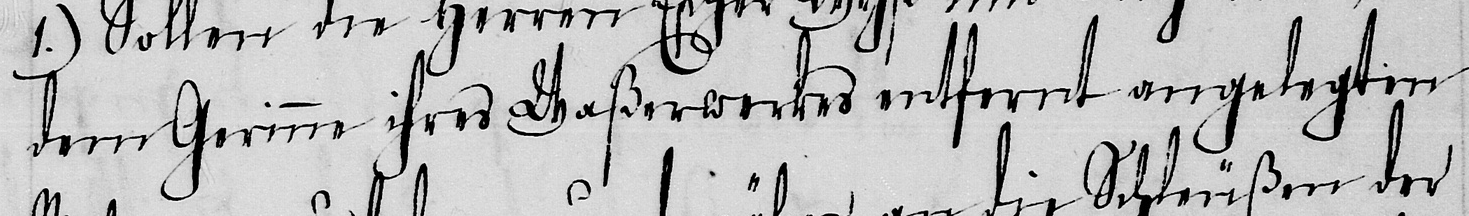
dem Gerinne ihres Waßerwerkes entfernt angelegten
